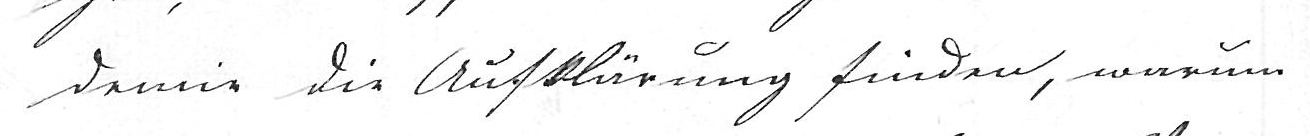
demie die Aufklärung finden, warum
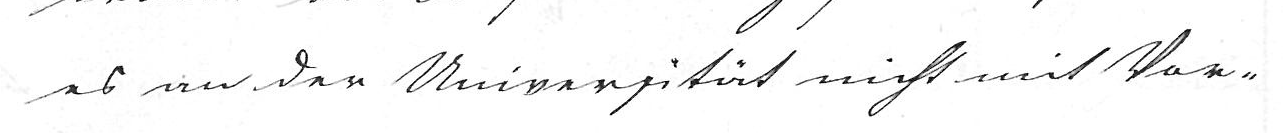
es an der Universität nicht mit Von-
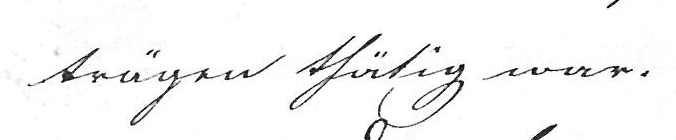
trägen thätig war.
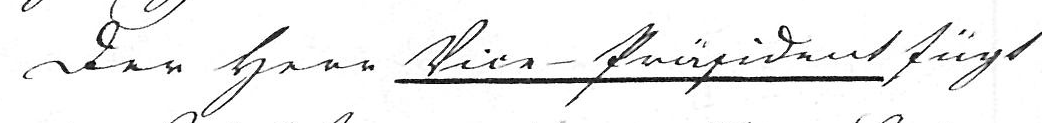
Der Herr Vice-Präsident fügt
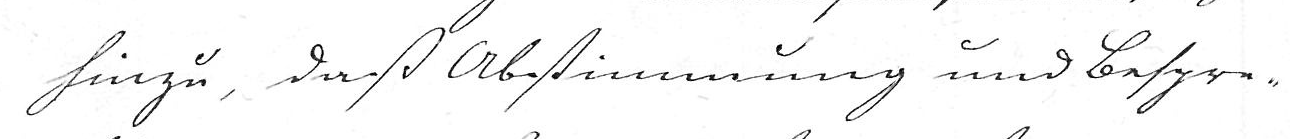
hinzu, daß Abstimmung und Bespre-
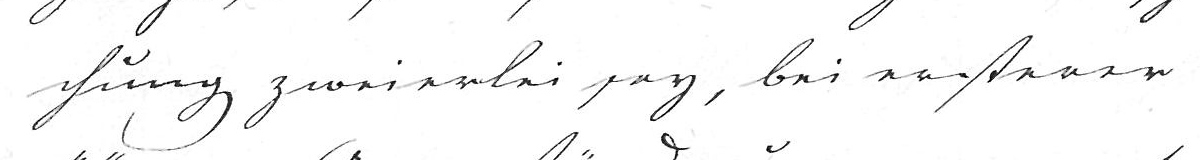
chung zweierlei sey, bei ersterer
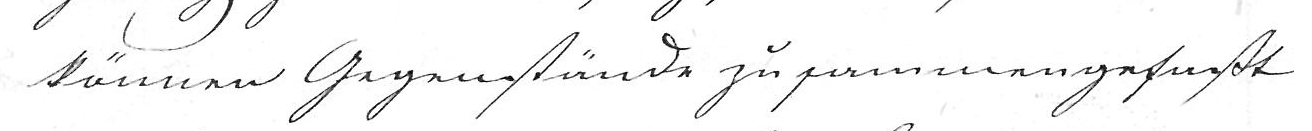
können Gegenstande zusammengefaßt
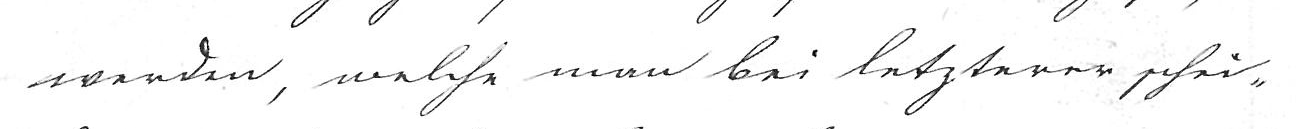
werden, welche man bei letzterer schei-
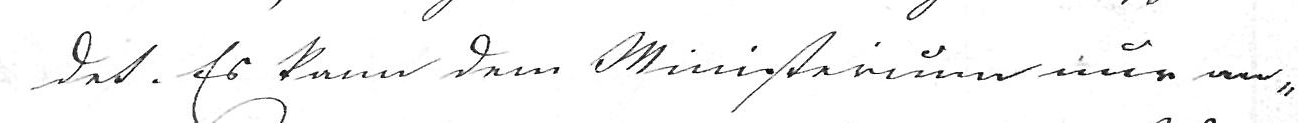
det. Es kann dem Ministerium nur an-
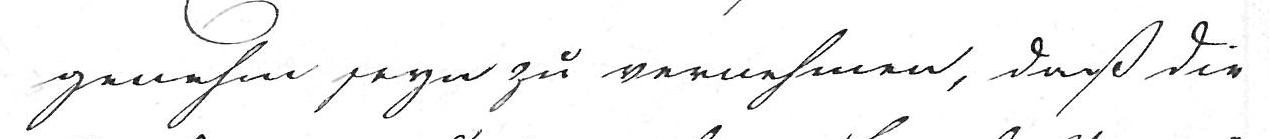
genehm seyn zu vernehmen, daß die
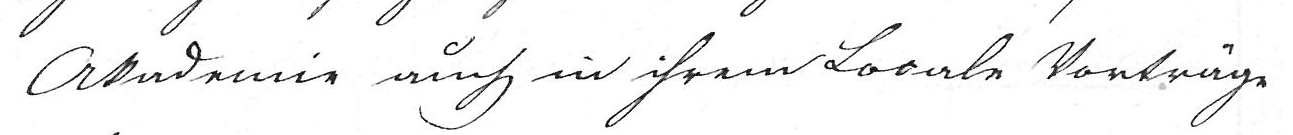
Akademie auch in ihren Locale Vorträge
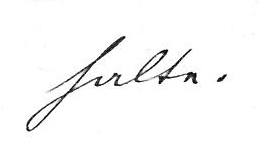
halte.
